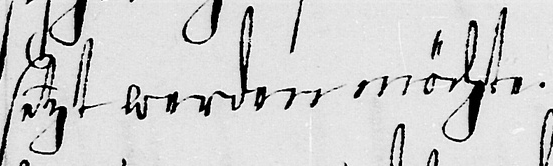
setzt werden möchte.
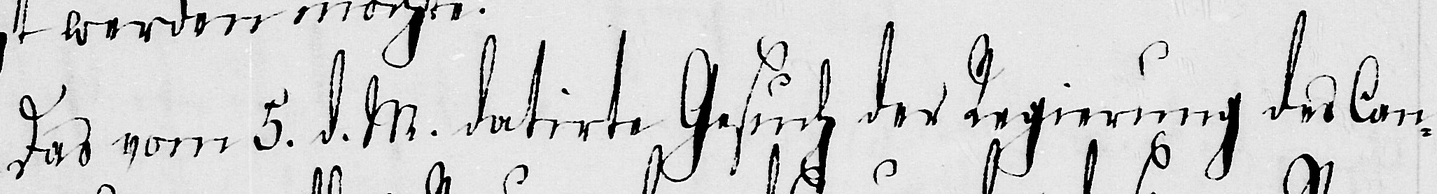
Das vom 5. d. M. datirte Gesuch der Regierung des Can¬
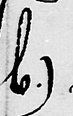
b.)
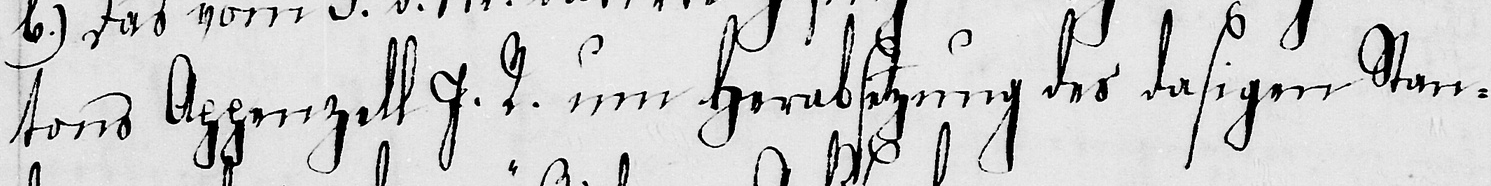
tons Appenzell I. R. um Herabsetzung des dasigen Stan¬
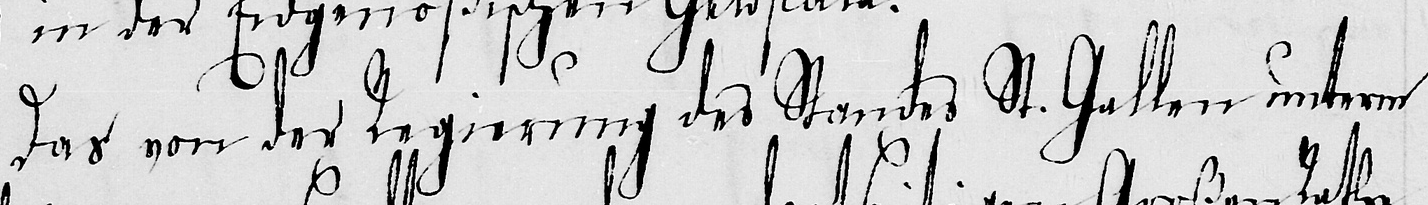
Das von der Regierung des Standes St.Gallen unterm
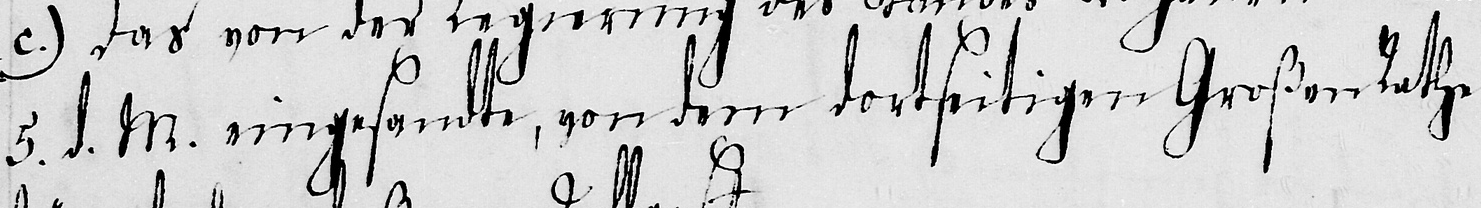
5. d. M. eingesandte, von dem dortseitigen Großen Rathe
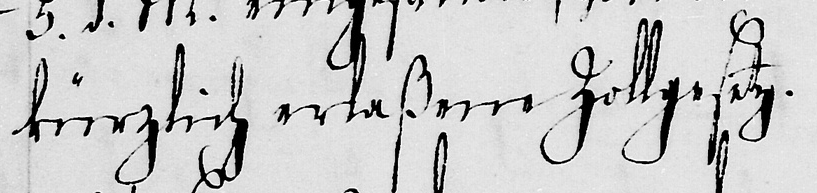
kürzlich erlaßene Zollgeset¬
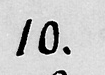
10.
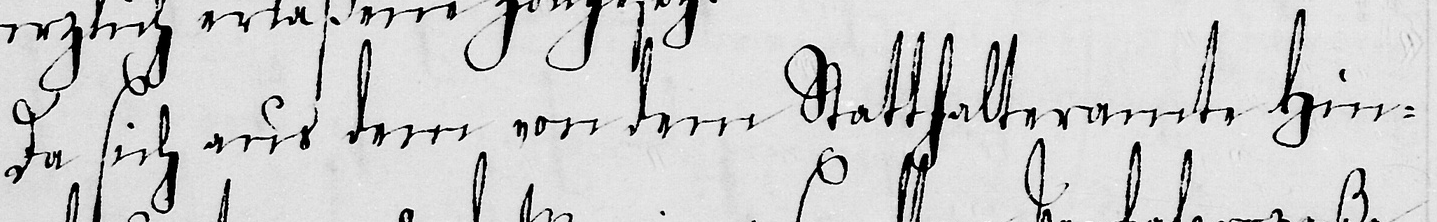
Da sich aus dem von dem Statthalteramte Hin¬
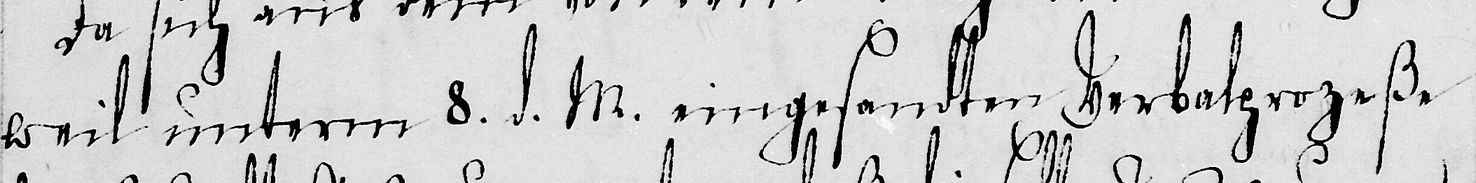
weil unterm 8. d. M. eingesandten Verbalprozeße
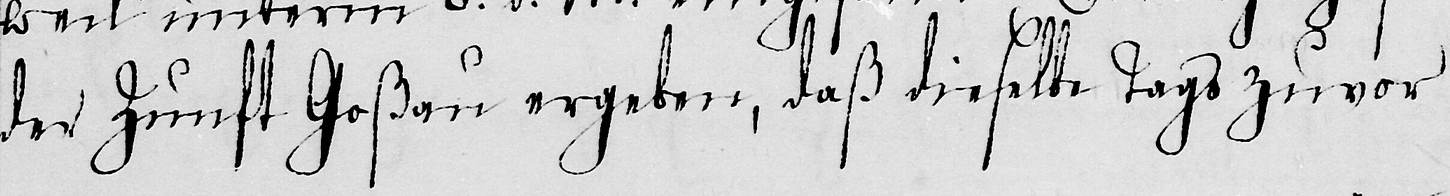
der Zunft Goßau ergeben, daß dieselbe Tags zuvor
